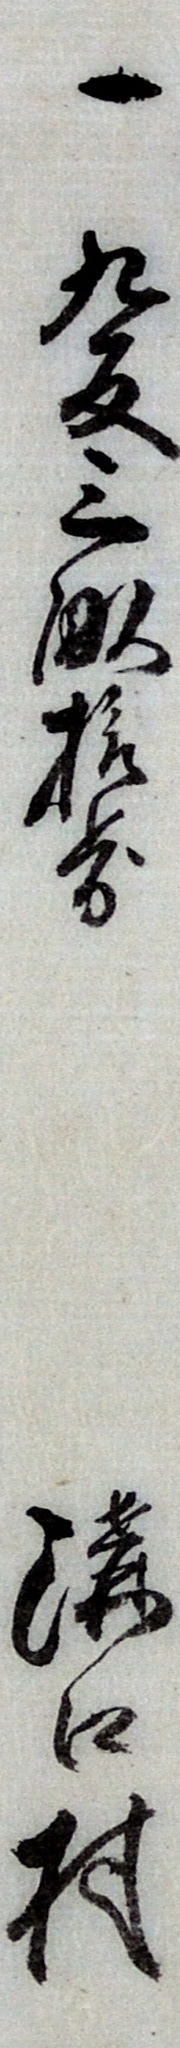一九反三㽗拾歩溝口村
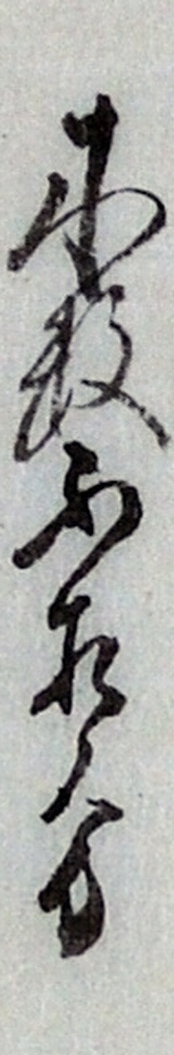木数不相分
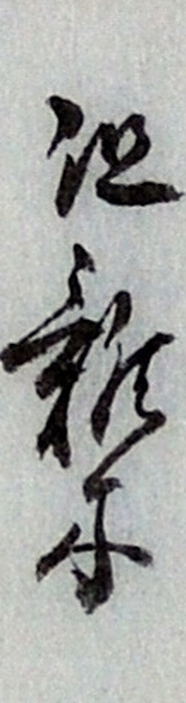但雑木
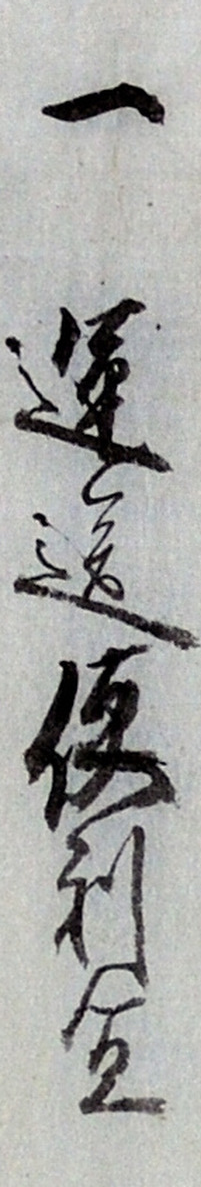一運送便利宜
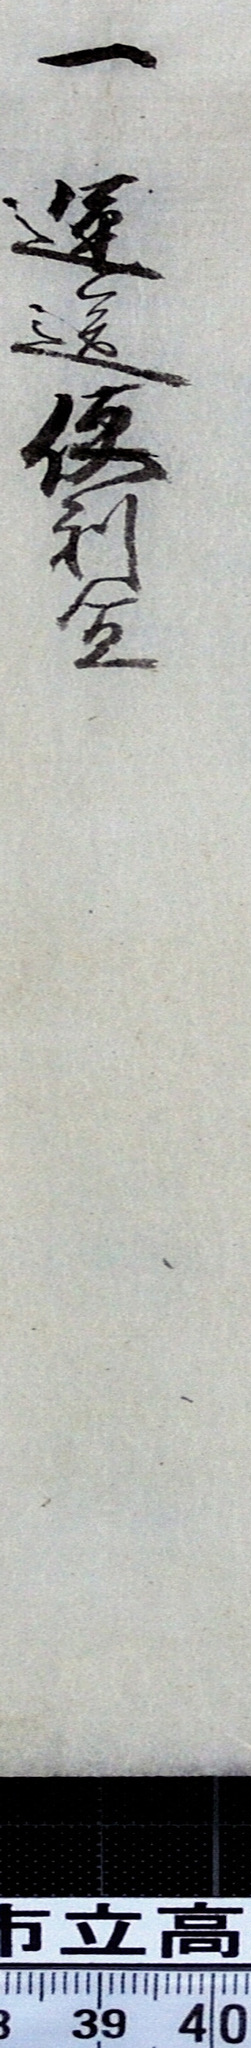一運送便利宜
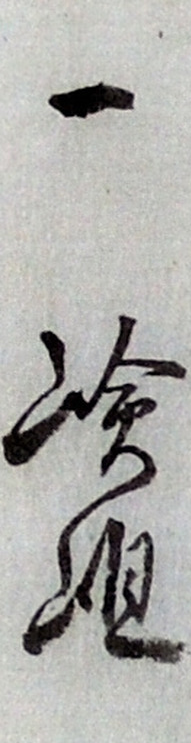一嶮岨

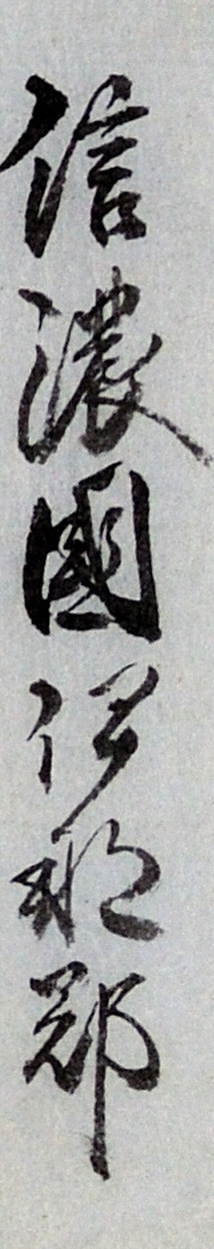信濃国伊那郡
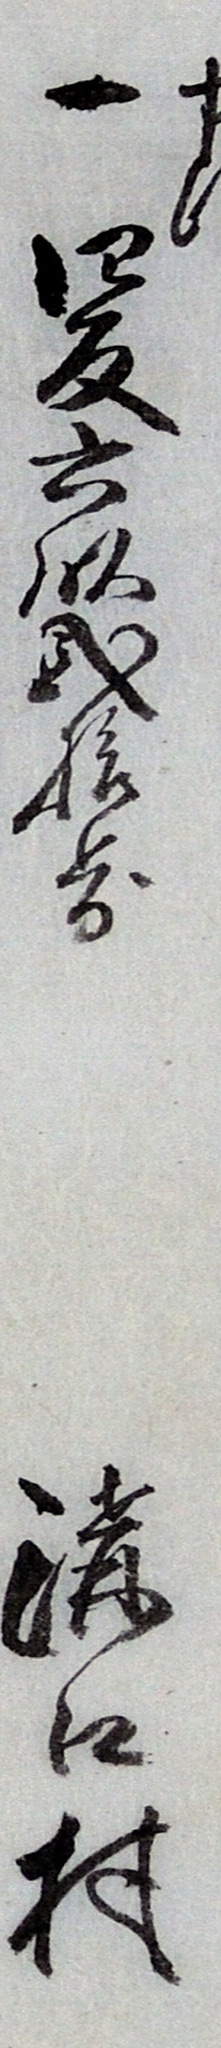一四反六㽗弐拾歩溝口村
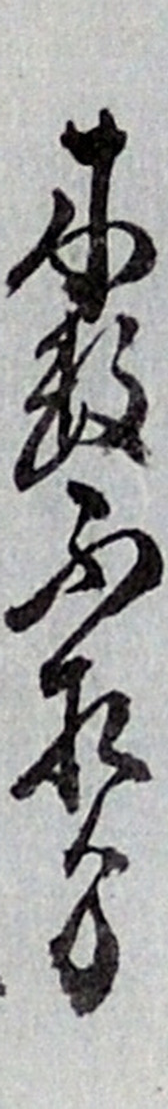木数不相分
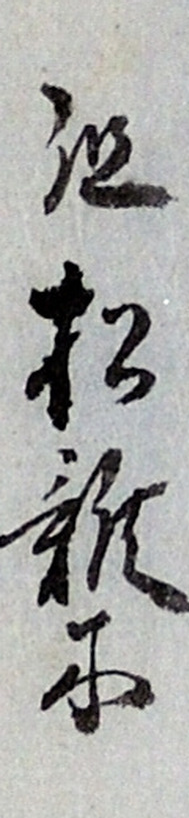但松雑木
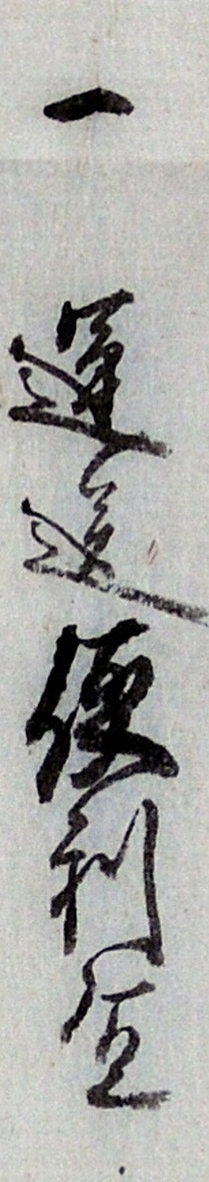一運送便利宜
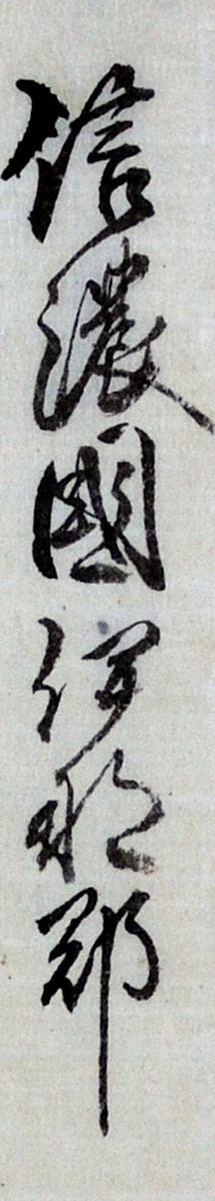信濃国伊那郡
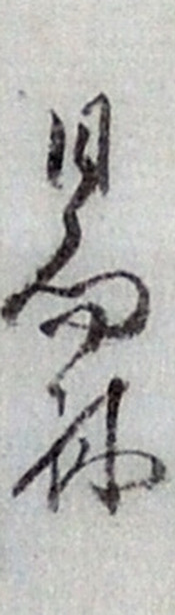日向林
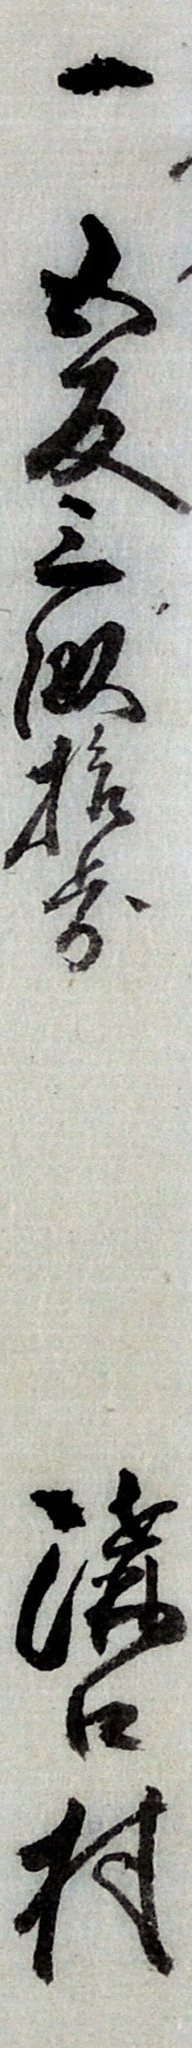一五反三㽗拾歩溝口村
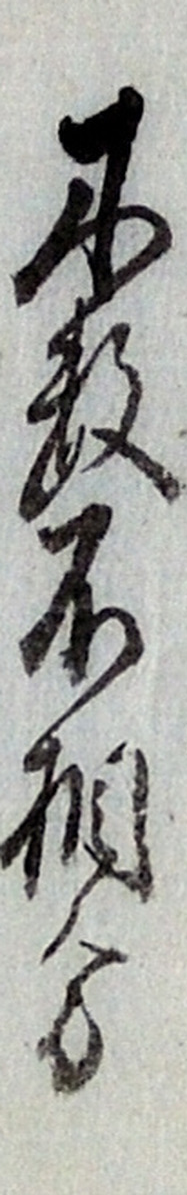木数不相分
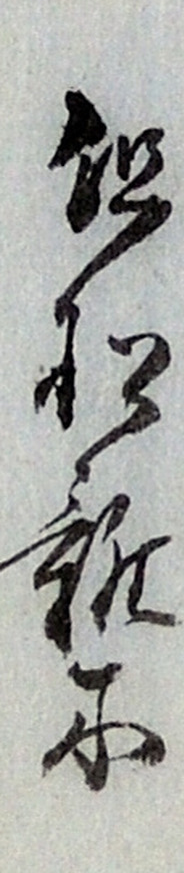但松雑木
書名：官林反別帳
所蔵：伊那市立高遠町図書館・合同会社AMANE
